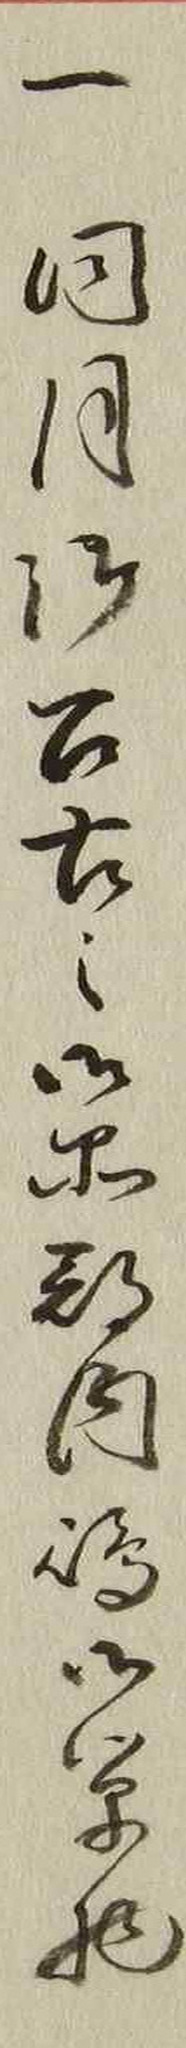一同月御召古之御品郡内嶋御単物
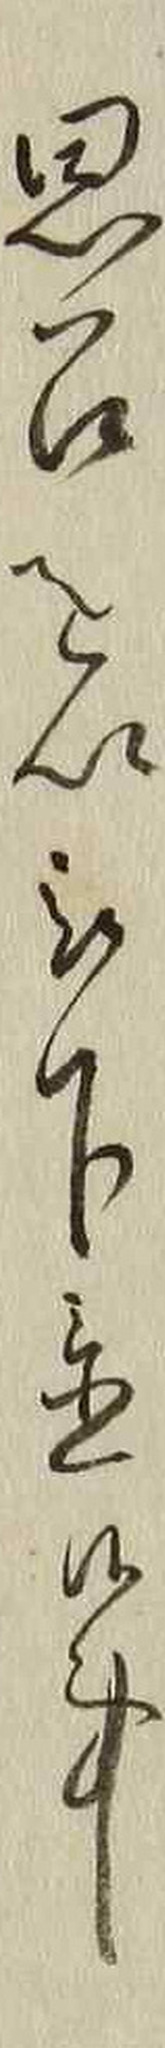思召を以被下置候事
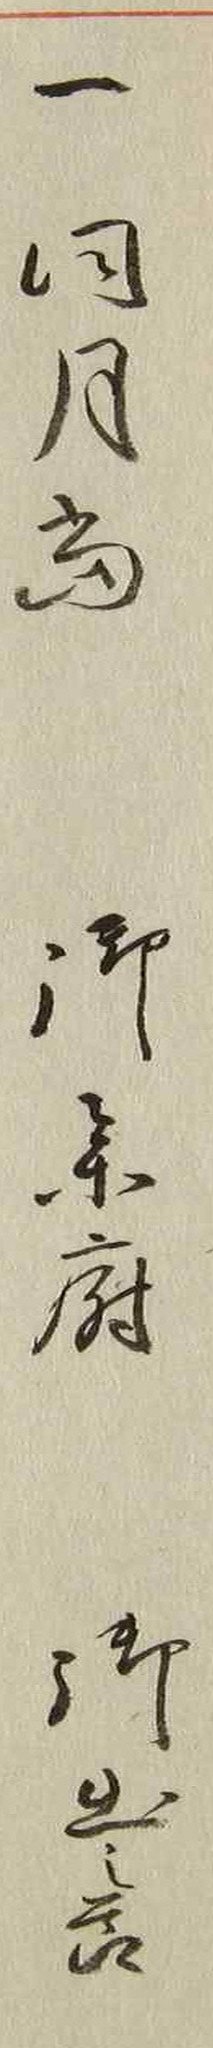一同月当御参府御出之節
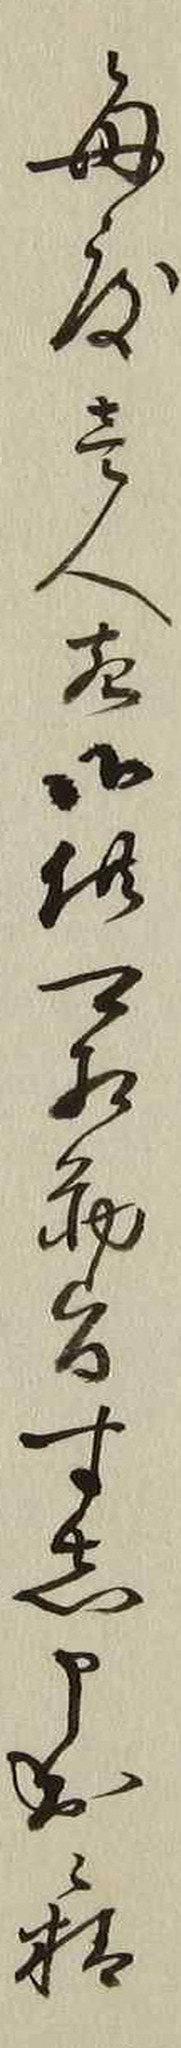毎度壱人宛御供可相勤旨寸志申出々精
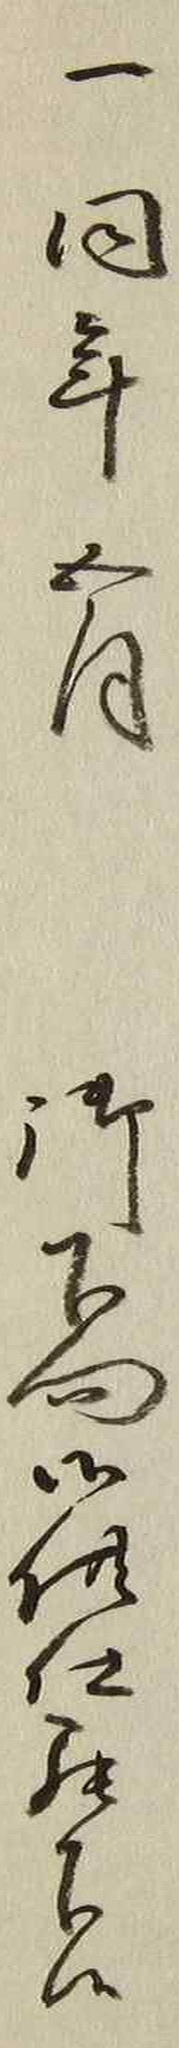一同年五月御下向御供仕罷下候
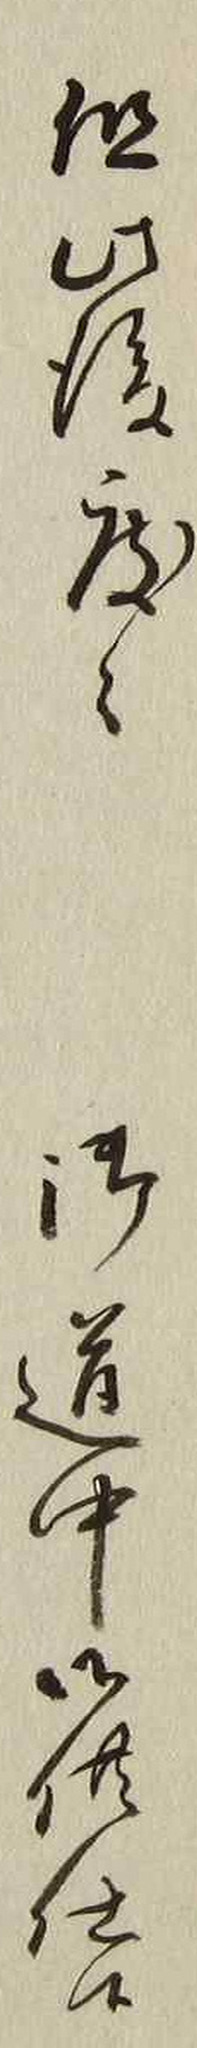但以後度々御道中御供仕候
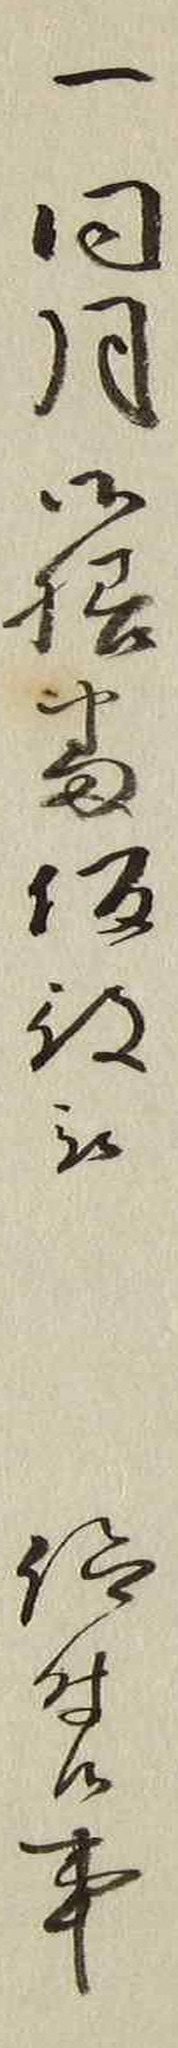一同月御膳番仮役被仰付候事
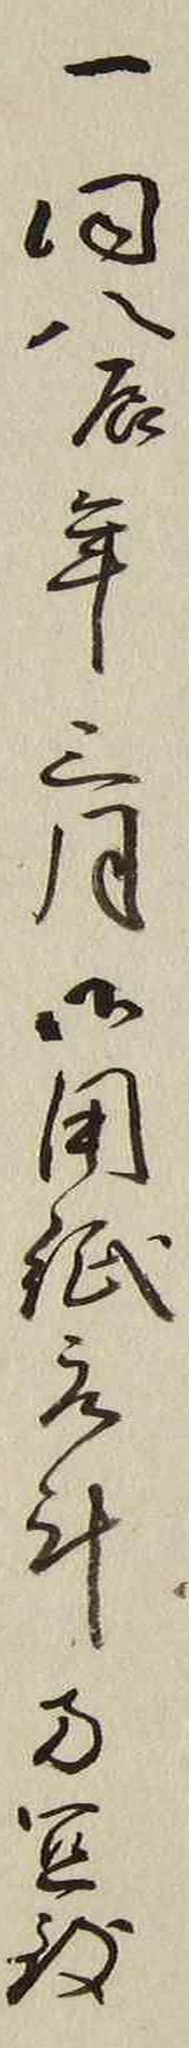一同八辰年三月御用紙取計方宜致
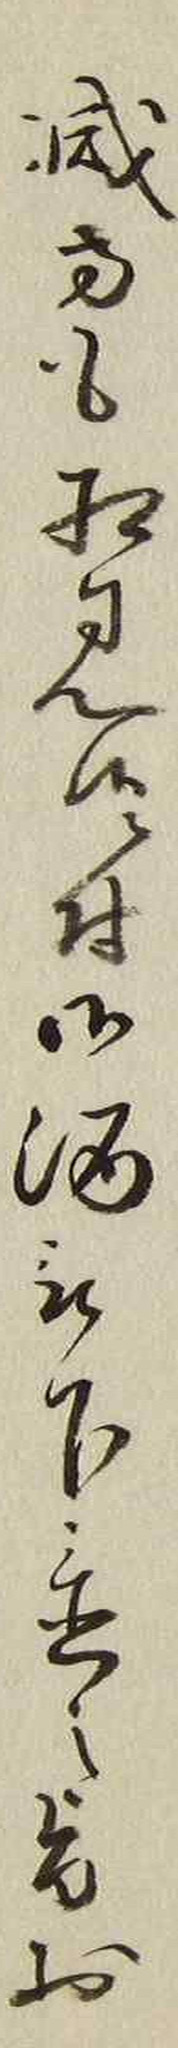減方も相見候ニ付御酒被下置之旨於
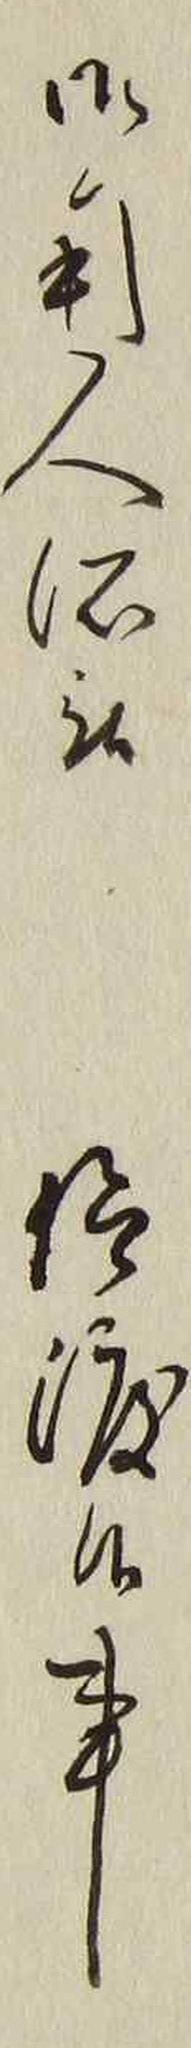御用人所被仰渡候事

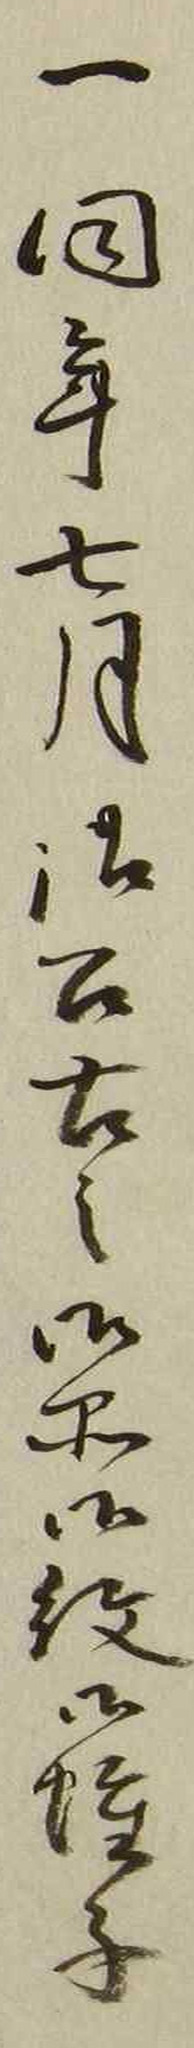一同年七月御召古之御品御紋御帷子
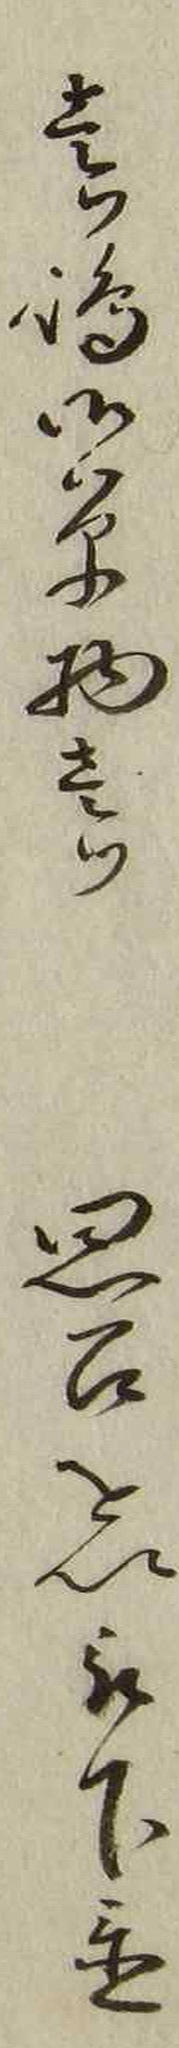壱ツ嶋御単物壱ツ思召を以被下置
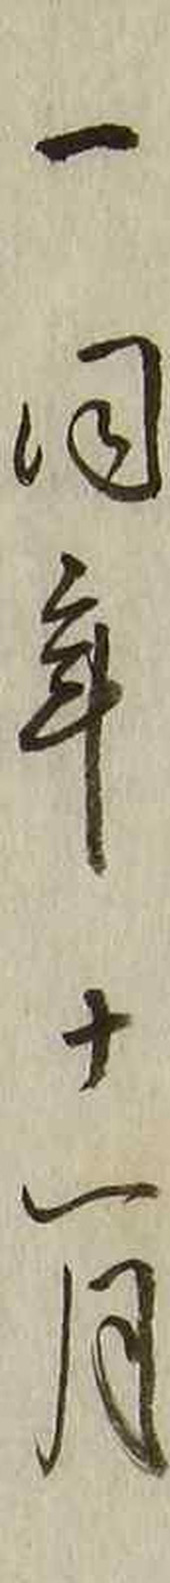一同年十一月
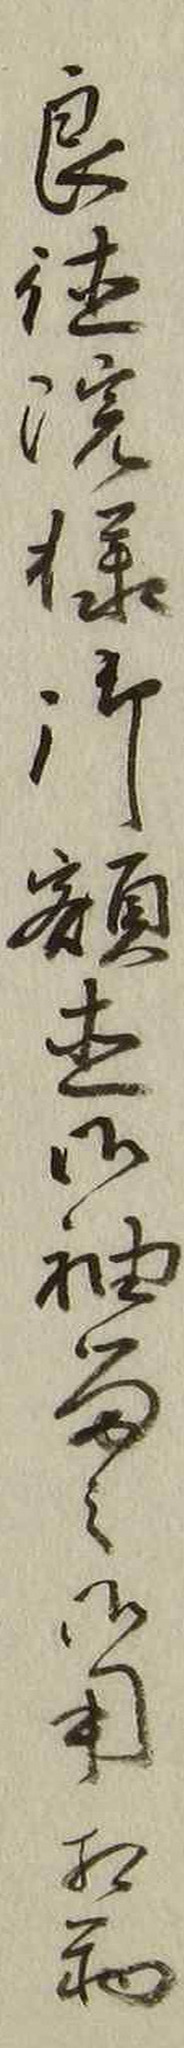良徳院様御額直御袖留之御用相勤
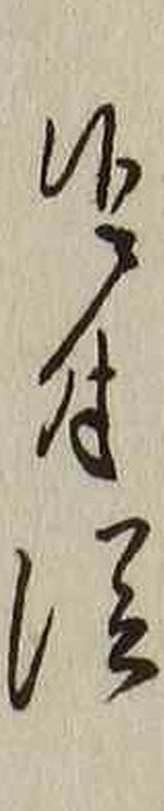候ニ付従
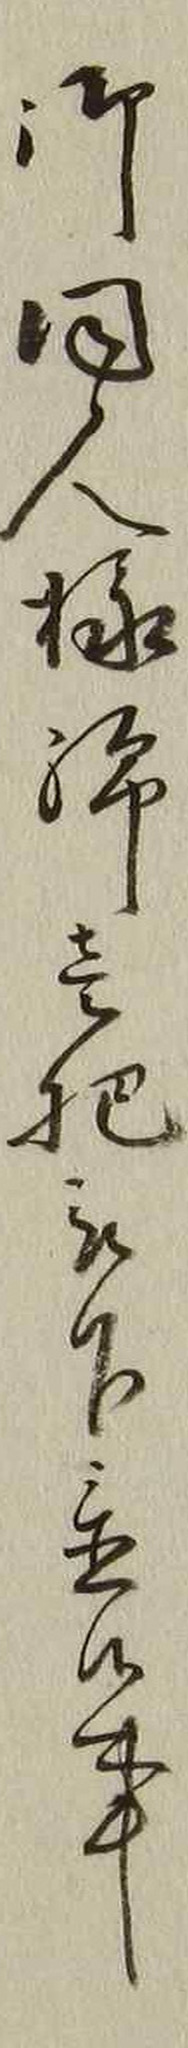御同人様綿壱把被下置候事
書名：諸士系譜　巻之4　い之部4
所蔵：会津若松市立会津図書館
